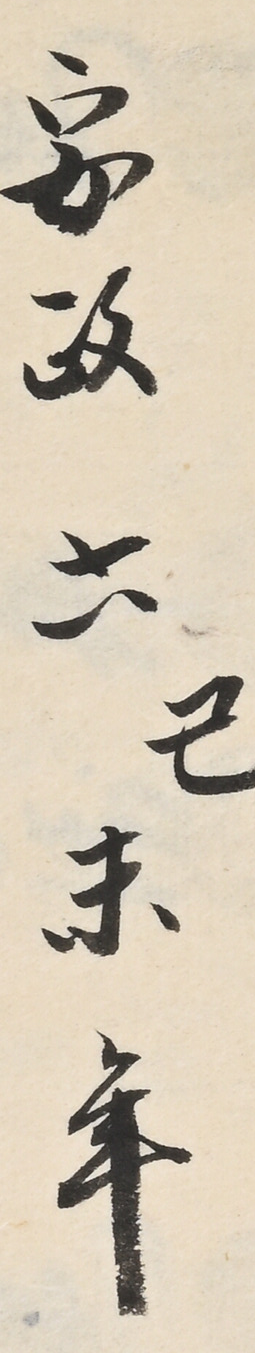㊞安政六己未年
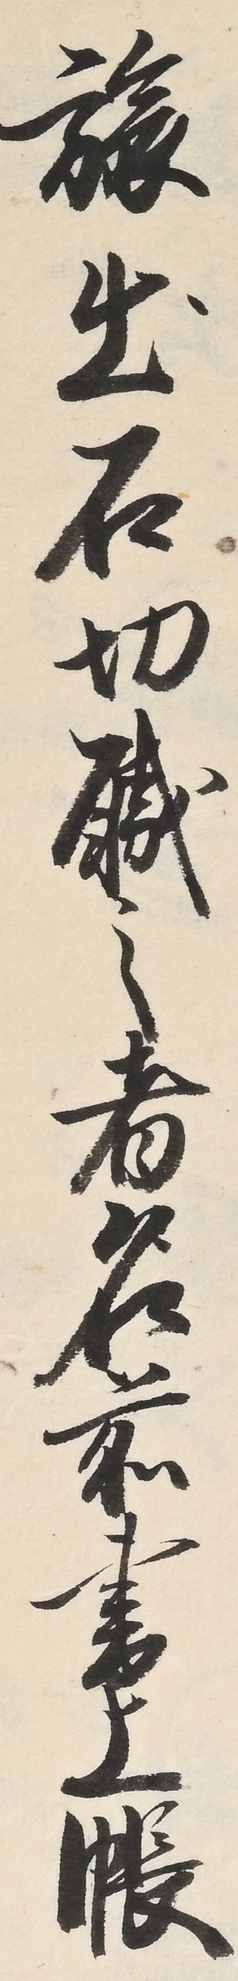旅出石切職之者名前書上帳
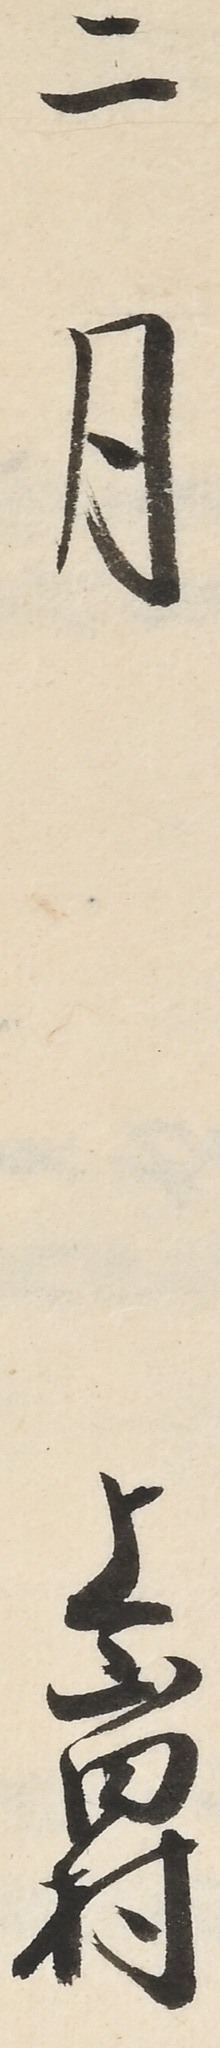㊞二月上山田村

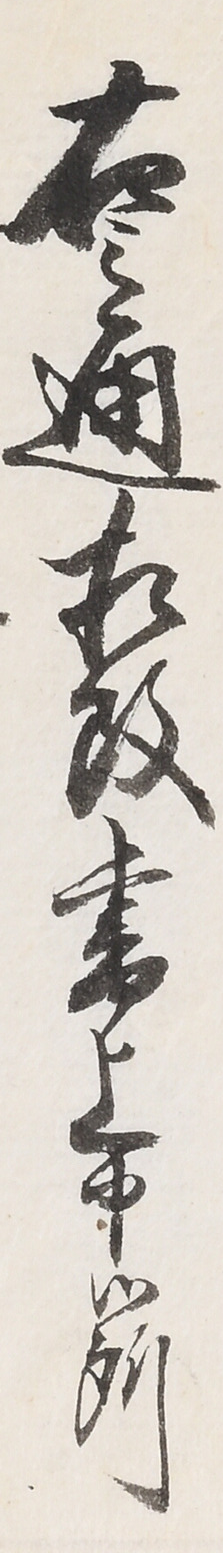右之通相改書上申候所
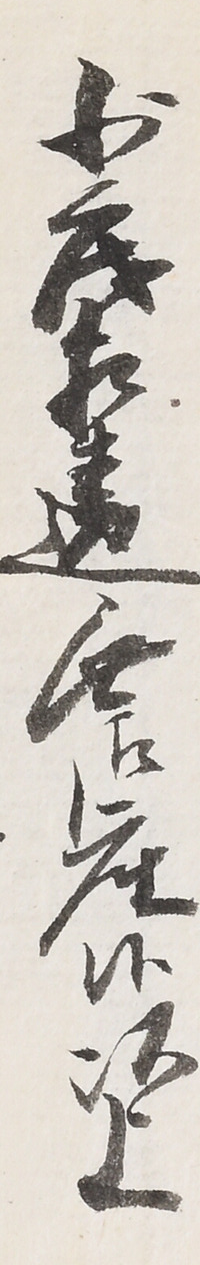少も相違無御座候以上
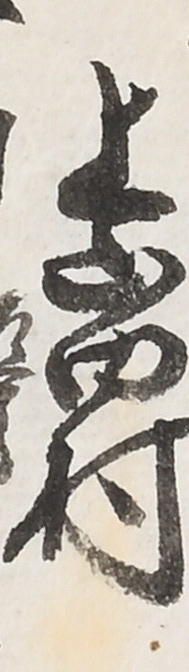上山田村
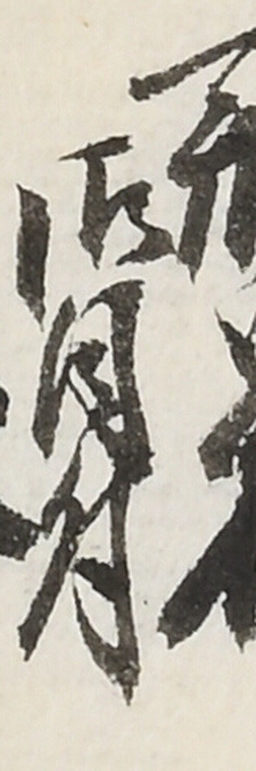御目付
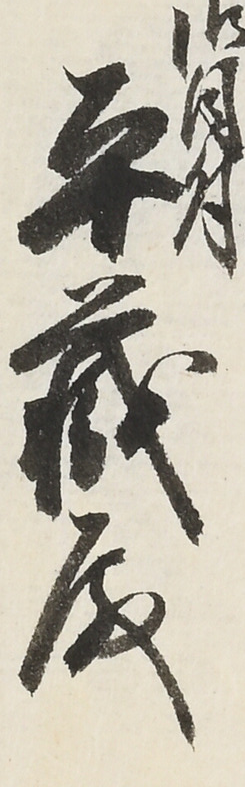平蔵殿
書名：安政六己未年二月旅出石切職之者名前書上帳
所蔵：伊那市立高遠町図書館・合同会社AMANE
